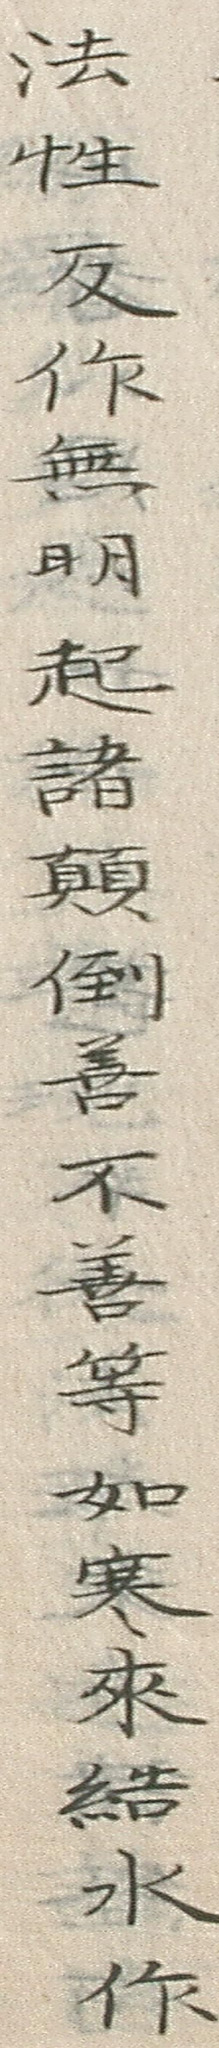法性反作無明起諸顛倒善不善如寒来結水作
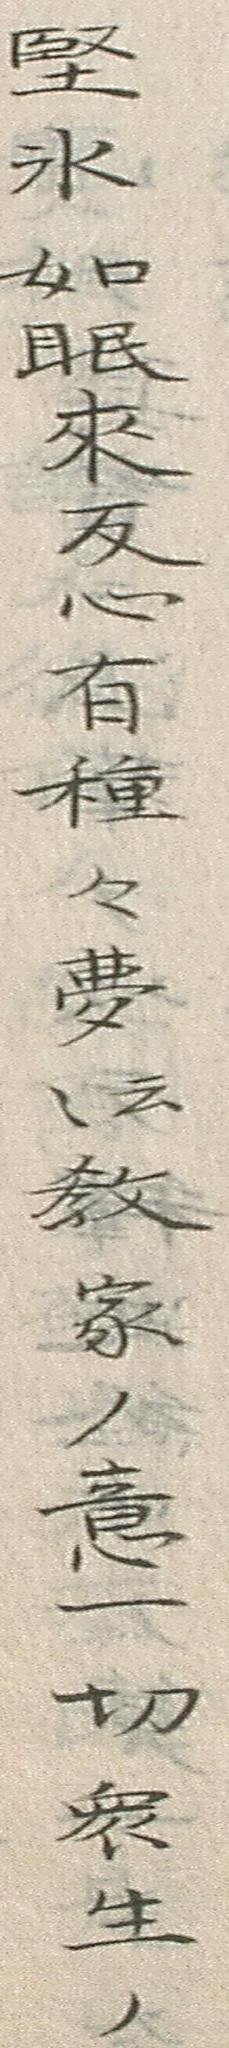堅氷如眠来反心有種々夢云〻教家ノ意一切衆生ノ
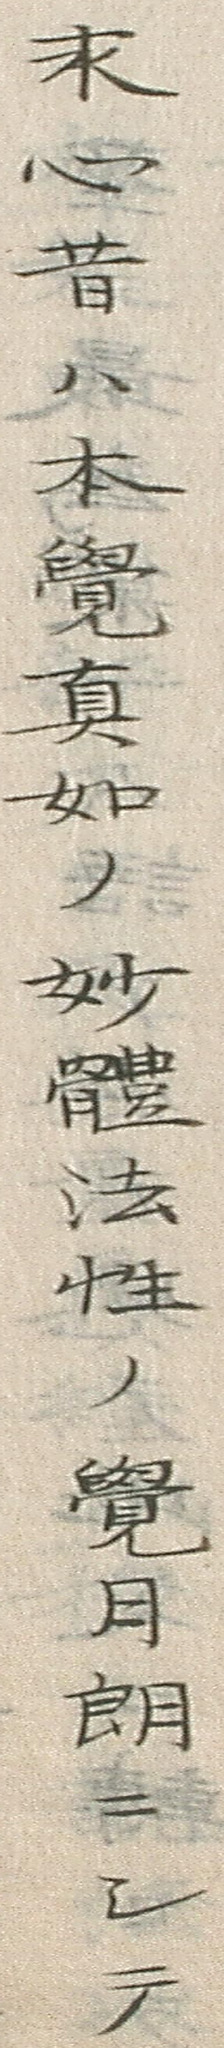求心昔ハ本覚真如ノ妙体法性ノ覚月朗ニシテ
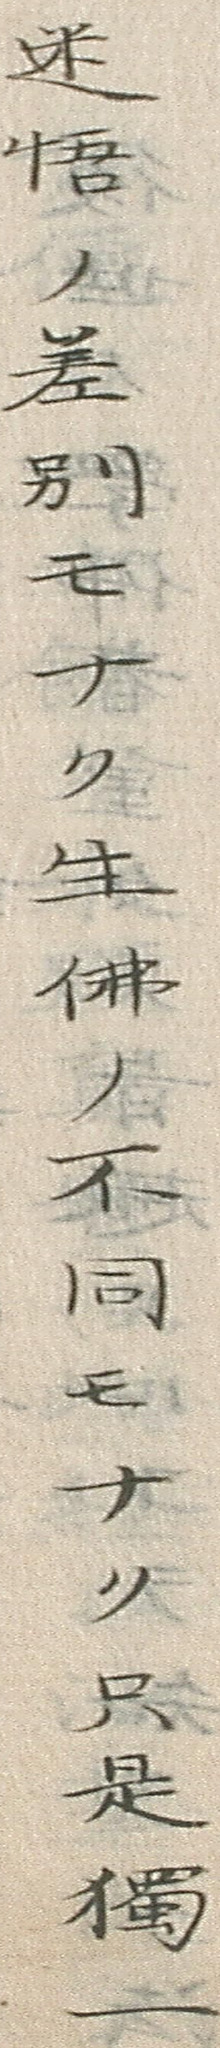迷悟ノ差別モナク生仏ノ不同モナク只是独一
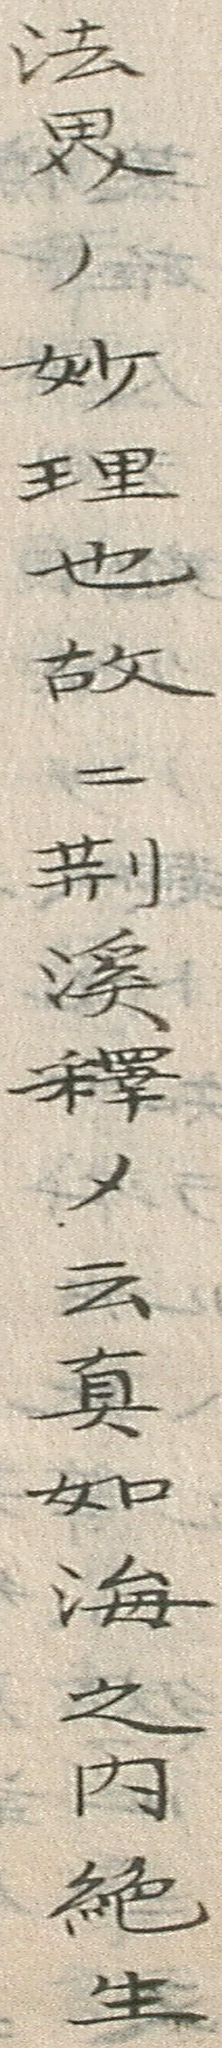法界ノ妙理也故ニ荊渓釈シテ云真如海之内絶生
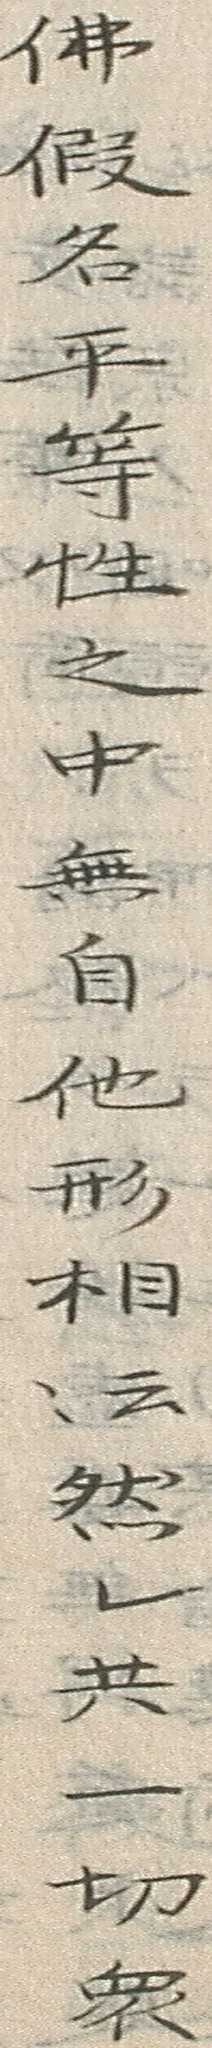仏仮名平等性之中無自他形相云〻然レ共一切衆
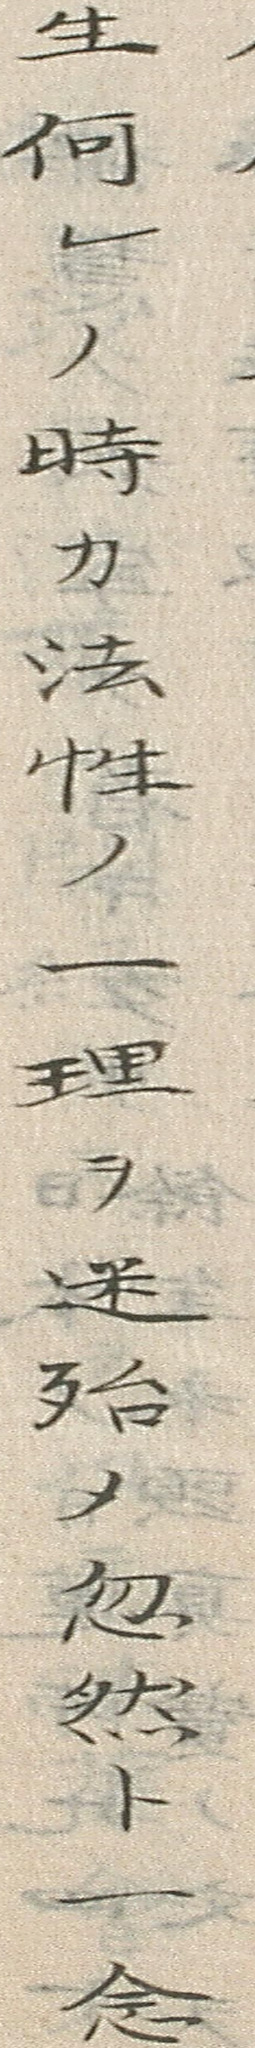生何レノ時カ法性ノ一理ヲ迷殆シテ忽然ト一念
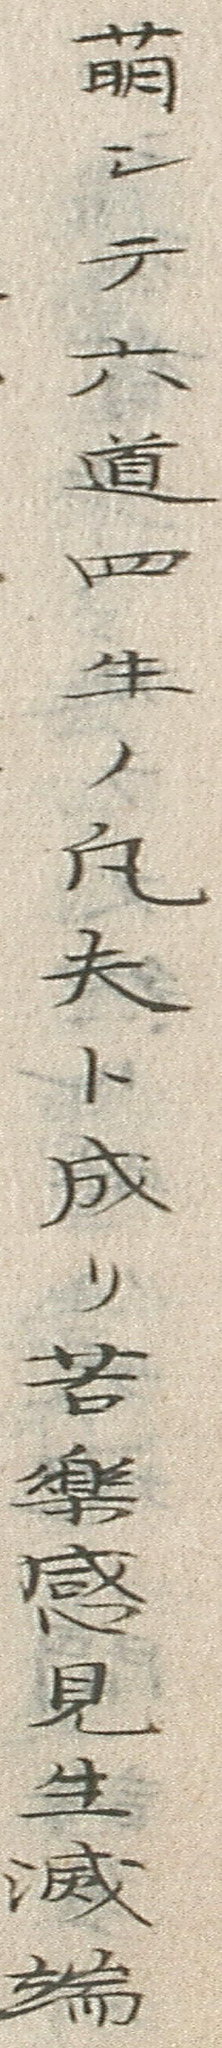萌シテ六道四生ノ凡夫ト成リ苦楽感見生滅端
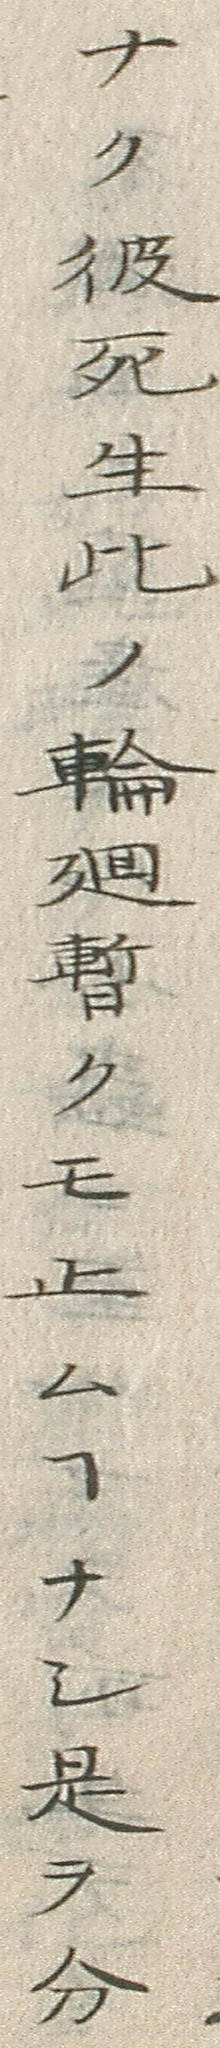ナク彼死生此ノ輪廻暫クモ止ムコトナシ是ヲ分
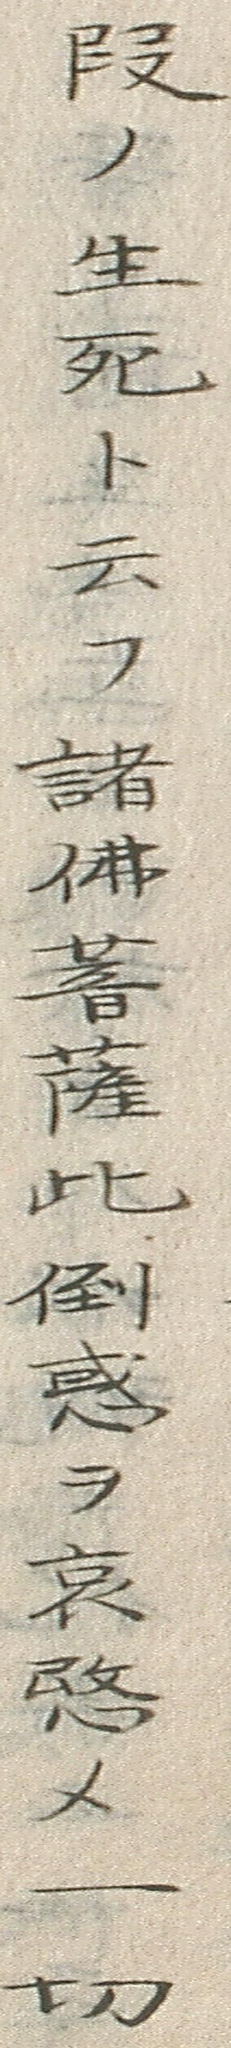叚ノ生死ト云フ諸仏菩薩此倒惑ヲ哀慇シテ一切
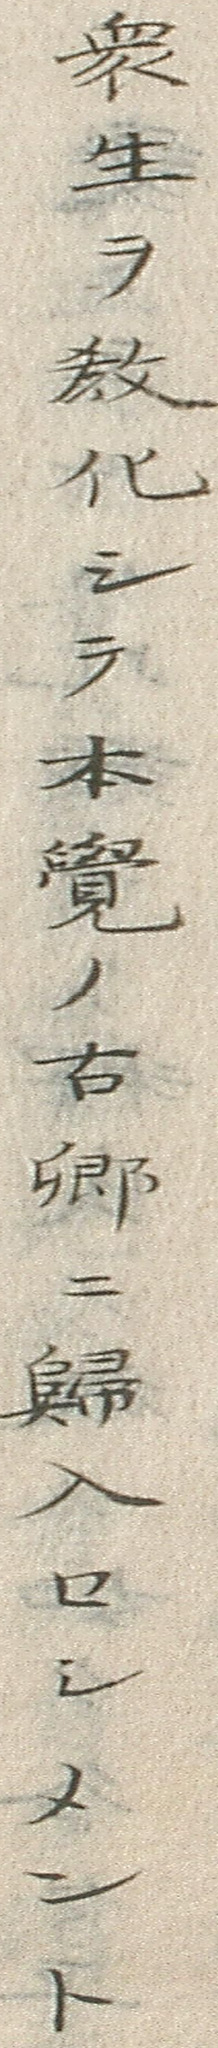衆生ヲ教化シテ本覚ノ古卿ニ帰入セシメント
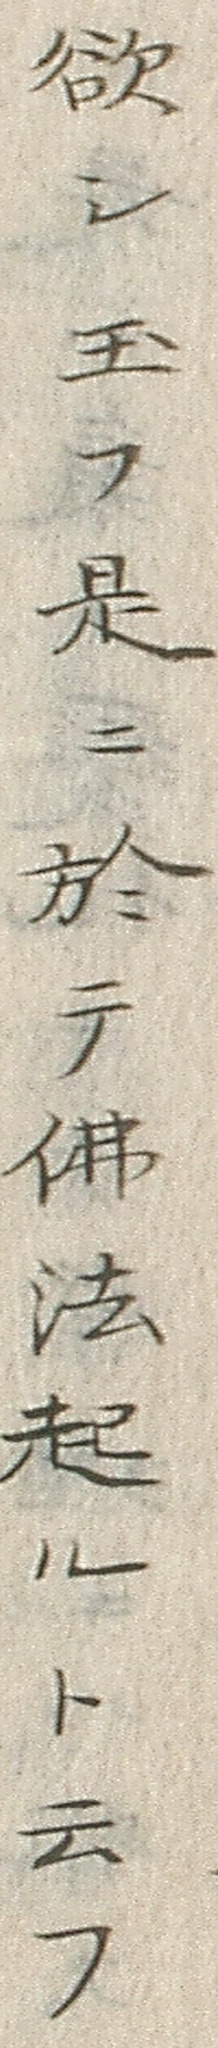欲シ玉フ是ニ於テ仏法起ルト云フ
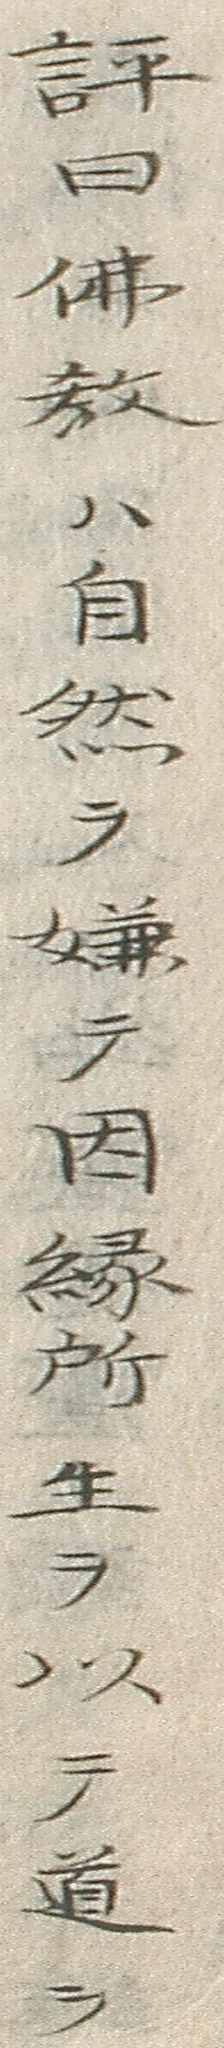評曰仏教ハ自然ヲ嫌テ因縁所生ヲ以テ道ヲ
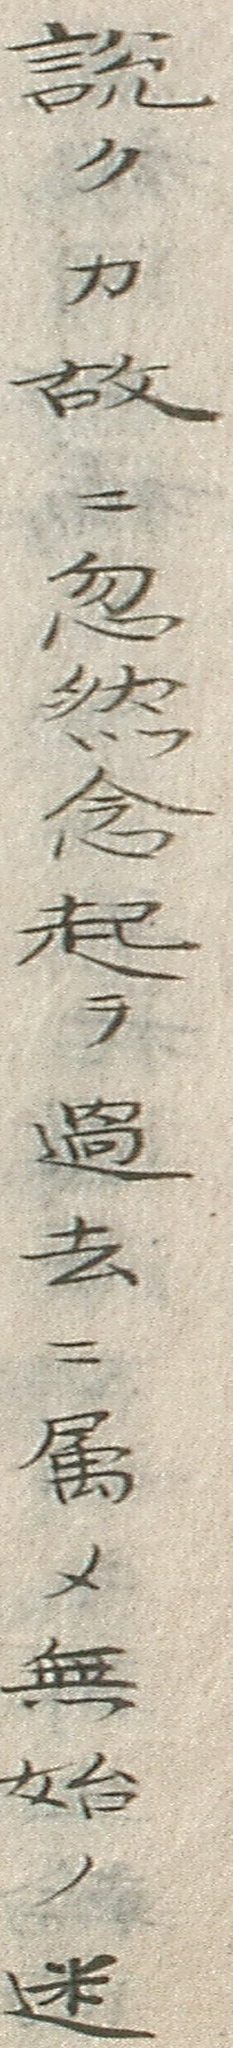説クカ故ニ忽然念起ヲ過去ニ属シテ無始ノ迷
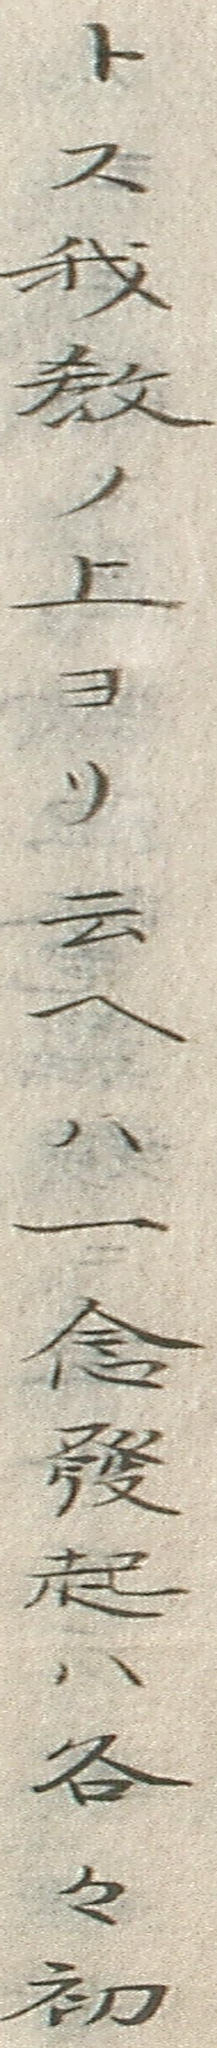トス我教ノ上ヨリ云ヘハ一念発起ハ各々初
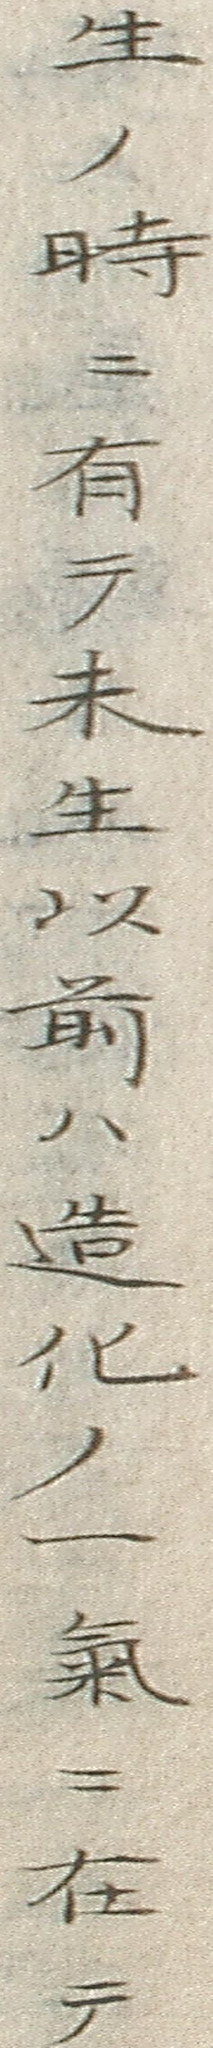生ノ時ニ有テ未生以前ハ造化ノ一気ニ在テ
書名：天學略名目羽翼　全
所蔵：東京大学地震研究所図書室 Earthquake Research Institute Library, The University of Tokyo, JAPAN
